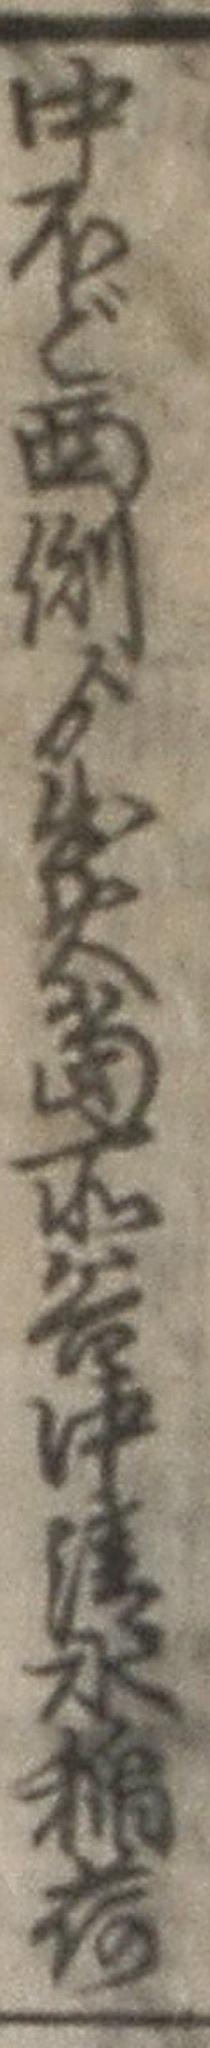中ほど西側ゟ出火当所谷中清水稲荷
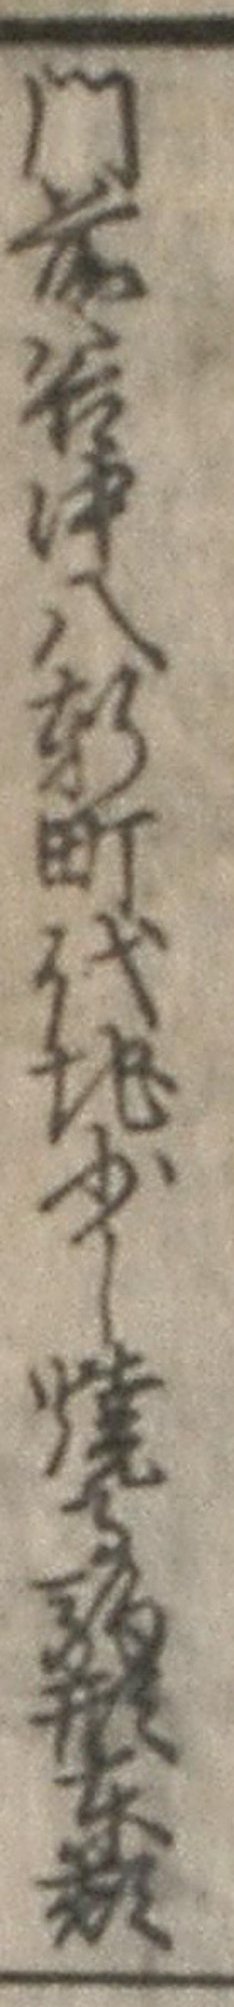門前谷中八軒町代地少し焼る駒形東側？
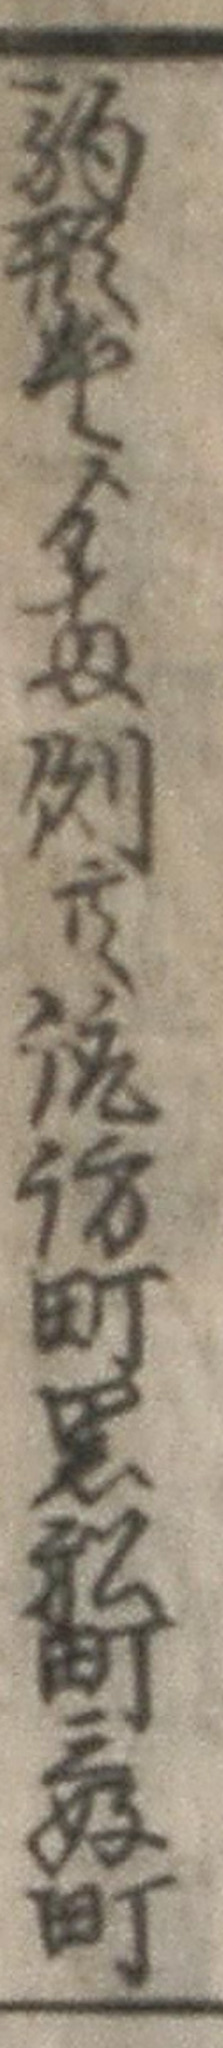駒形堂ゟ両側共諏訪町黒船町三好町
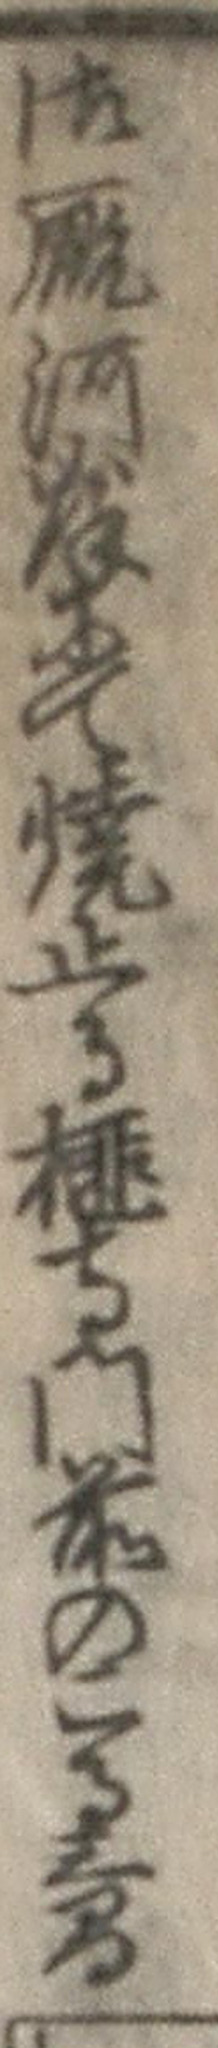御厩川岸にて焼止る榧寺門前のこる三間
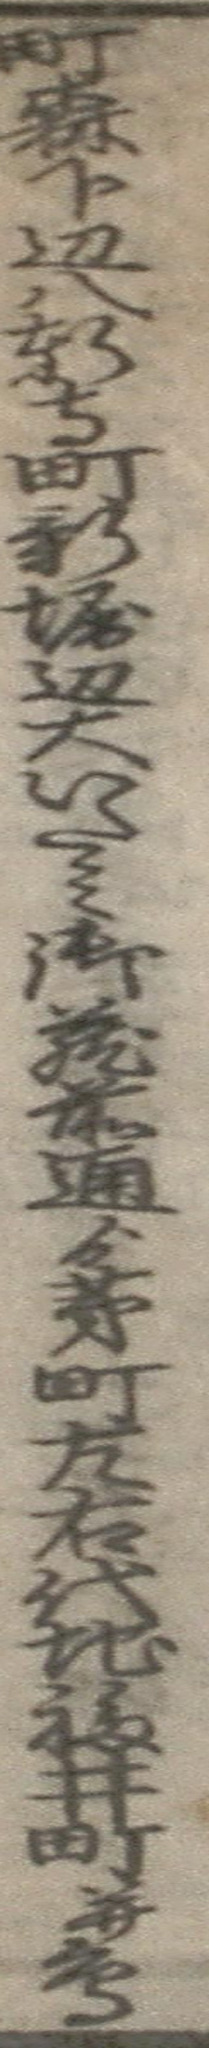町森下辺八軒寺町新堀辺大いたみ御蔵前通ゟ茅町左右代地福井町并鳥
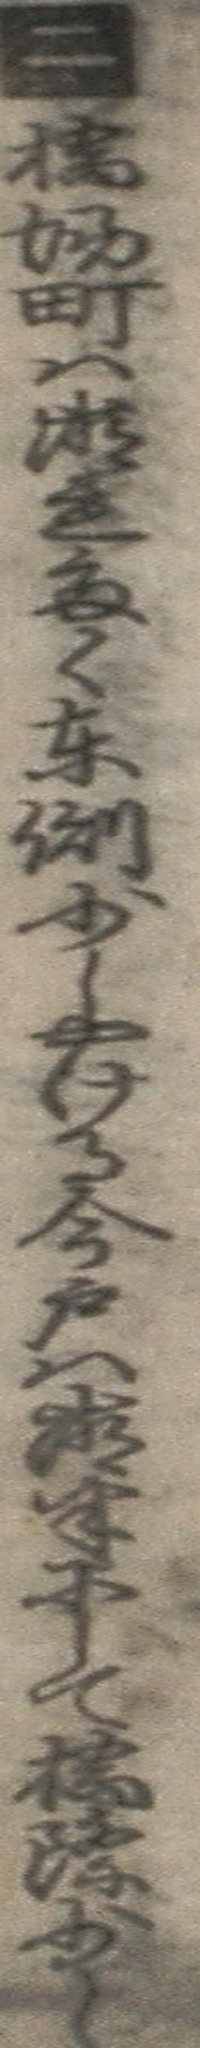二橋場町は崩多く東側少しやける今戸は崩半にして橋際少し
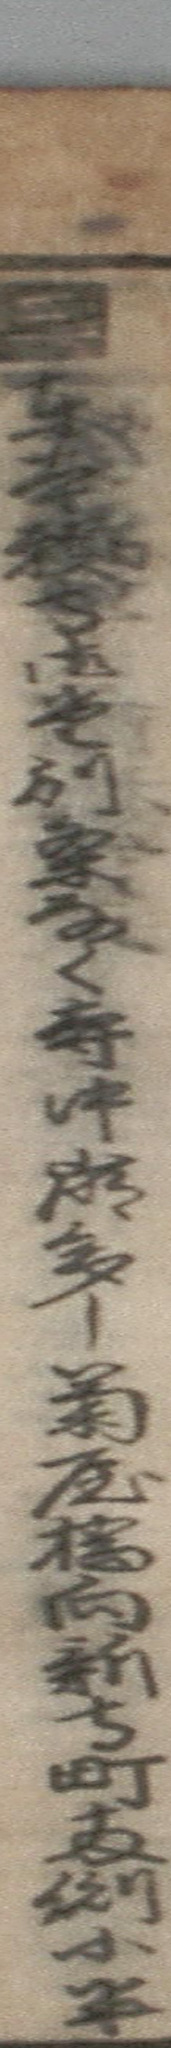三東本願寺御堂別条なく寺中崩多し菊屋橋向新寺町両側小半
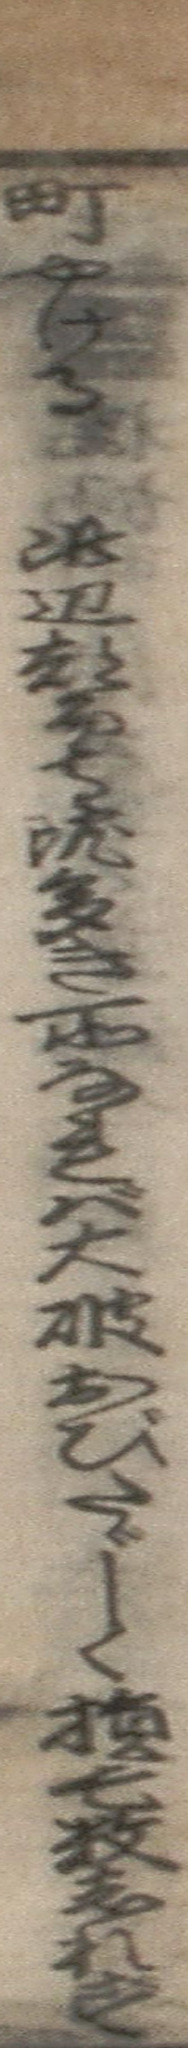町やける此辺都而寺院多き所なれば大破おびたゞしく損亡数しれず
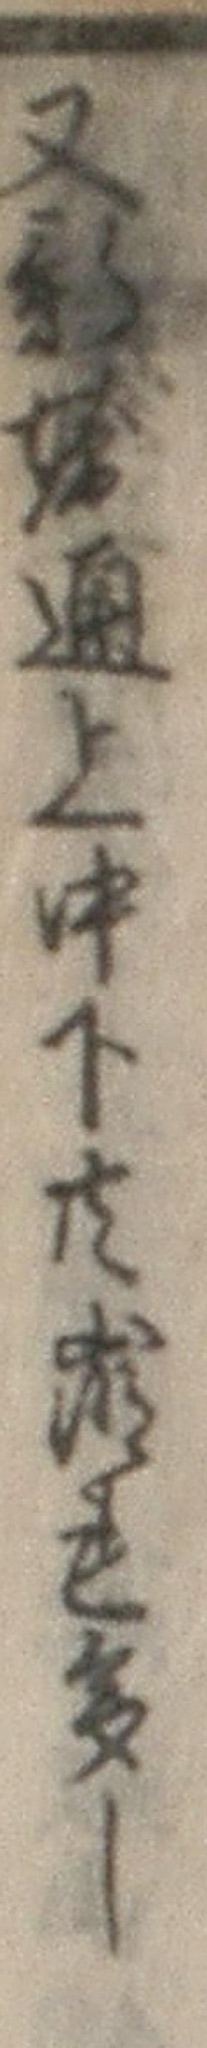又新堀通上中下共崩多し
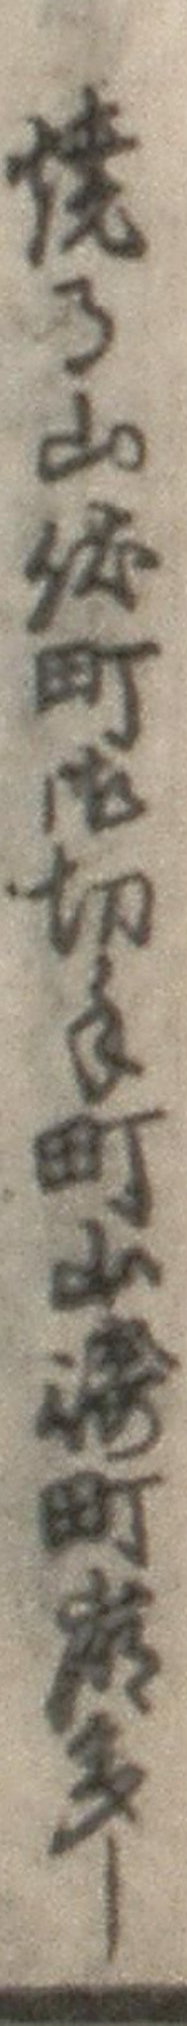焼る山伏町御切手町山崎町崩多し
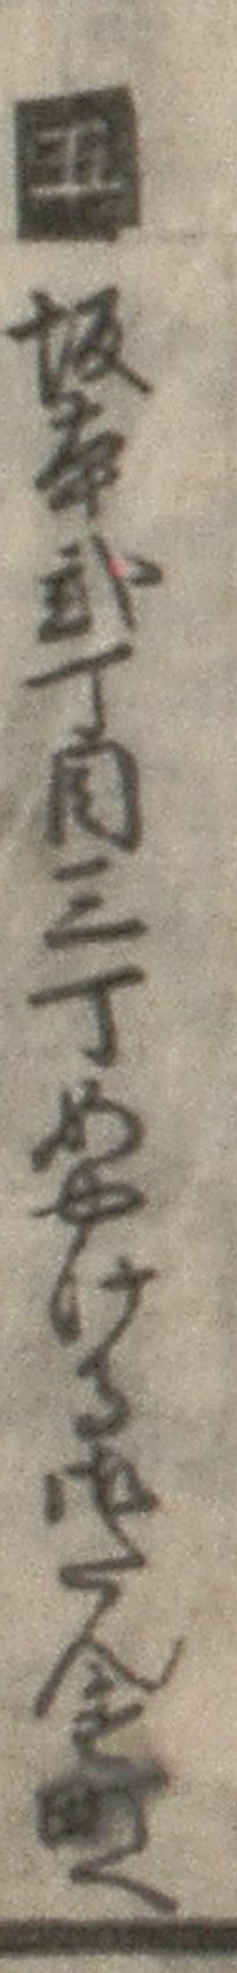五坂本弐丁目三丁めやける御たんす町は
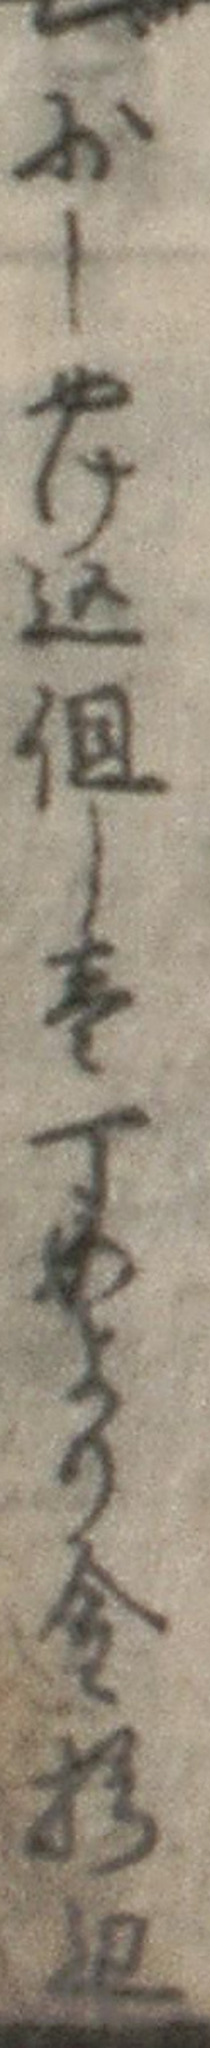少しやけ込但し壱丁めより金杉辺
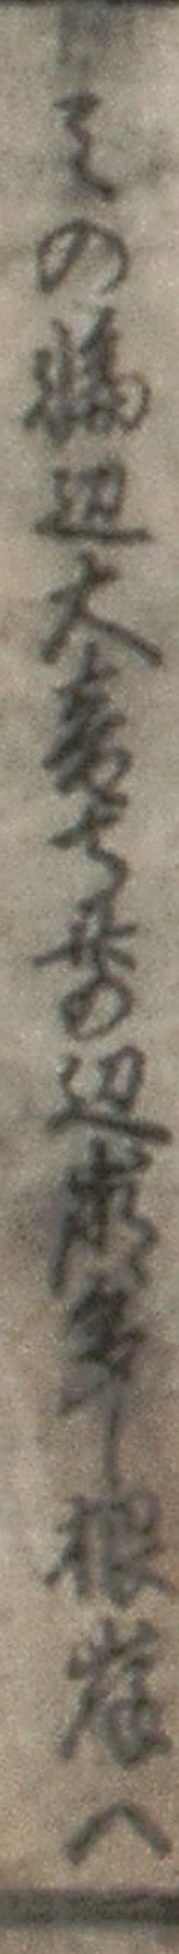みの輪辺大音寺前辺崩多し根岸は
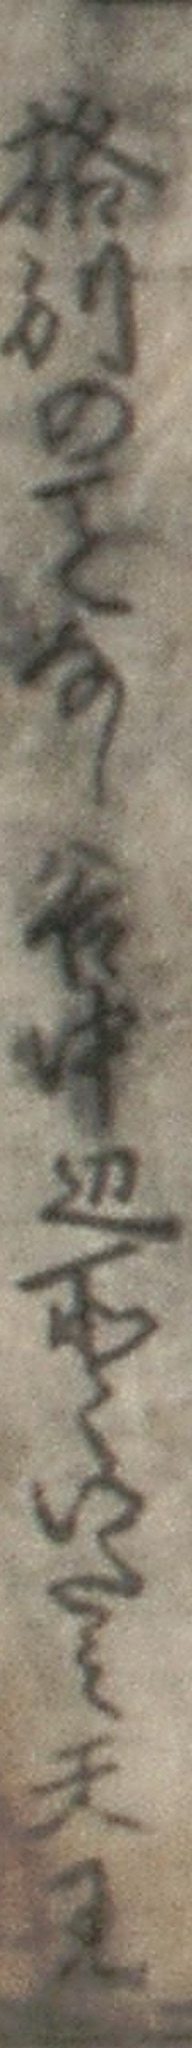格別のことなし谷中辺所〻いたみ天王

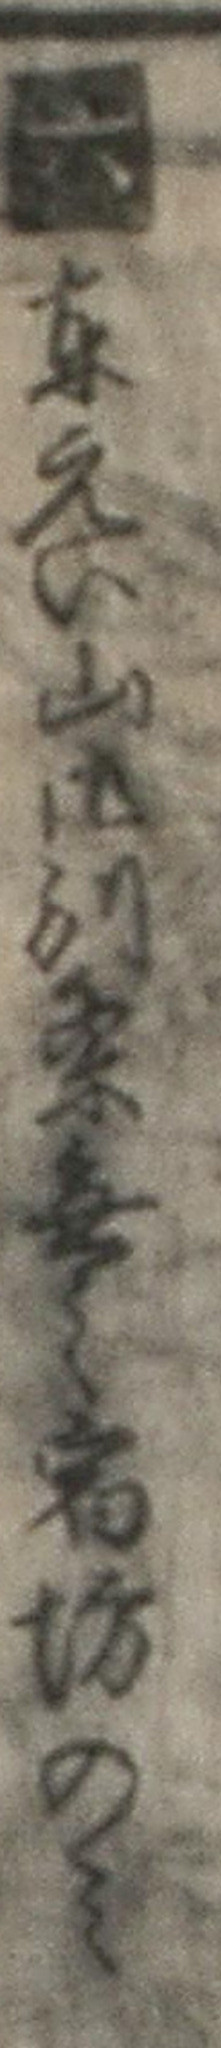六東えい山御別条無之宿坊のみ
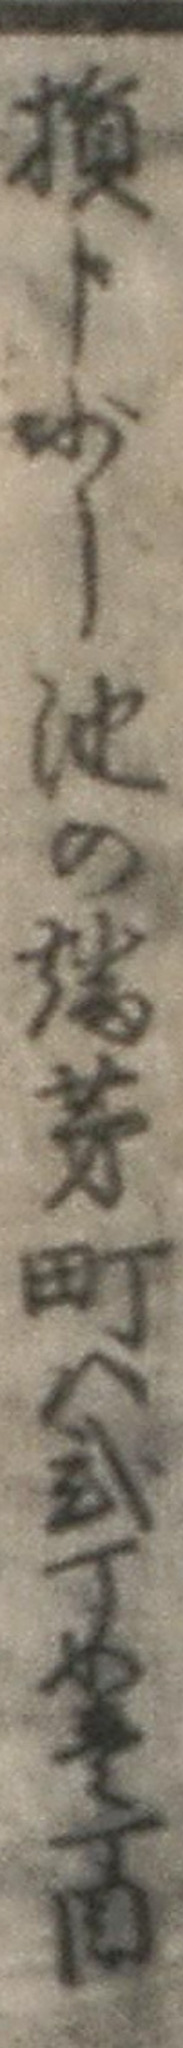損じ少し池の端茅町は弐丁め壱丁目
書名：江戸大地震末代鑑
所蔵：東京大学地震研究所図書室 Earthquake Research Institute Library, The University of Tokyo, JAPAN
